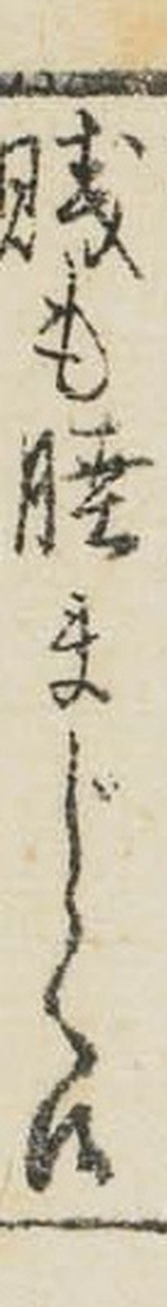賎も睦まじく候
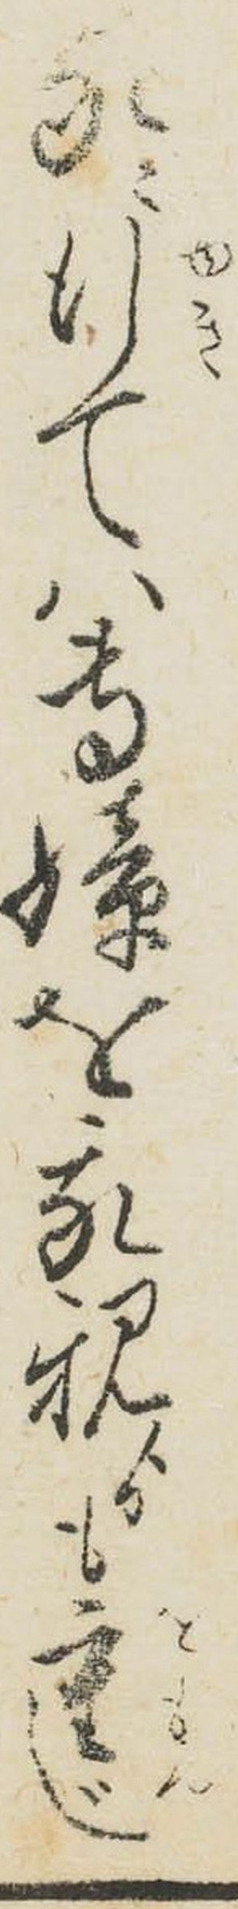家行ては専嫜を我親よりも重じ
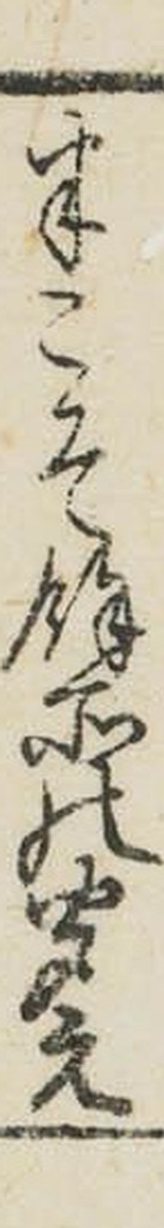半こそ余所の聞え
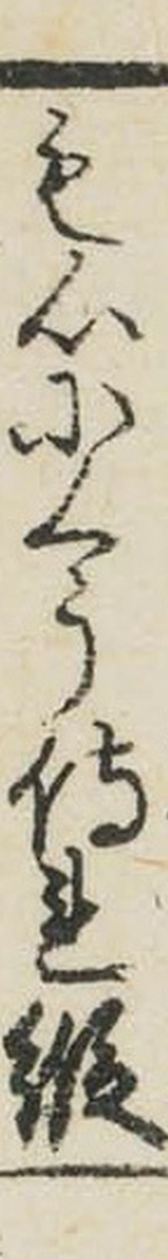も心にくう侍れ縦
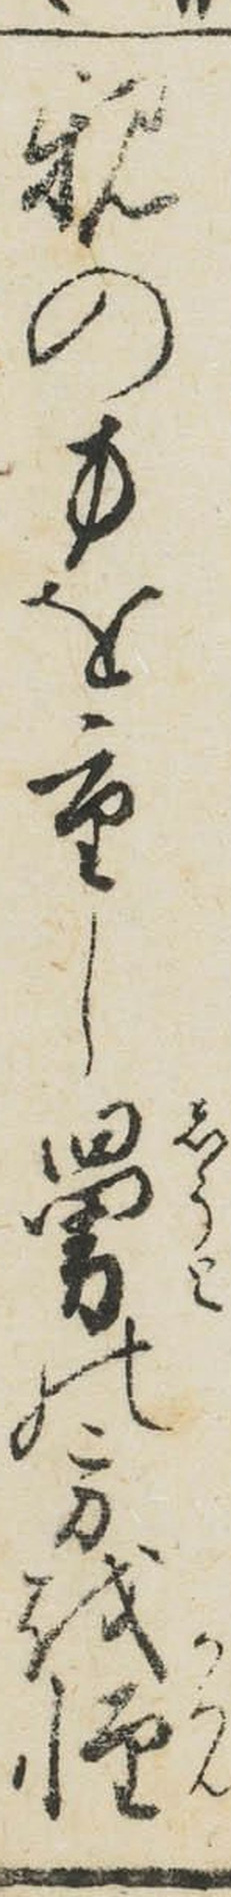親の方を重し舅の方を軽
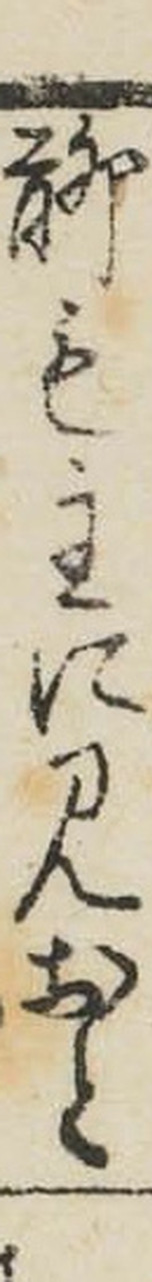聊も主に見おと
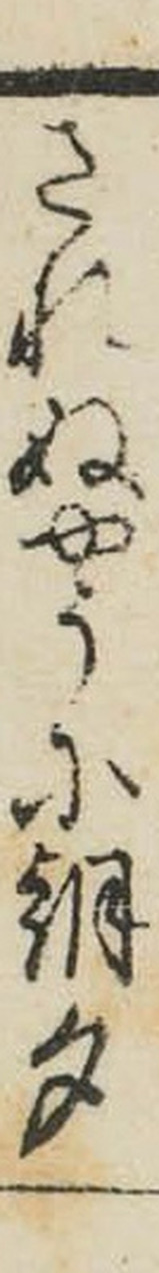されぬやうに朝夕
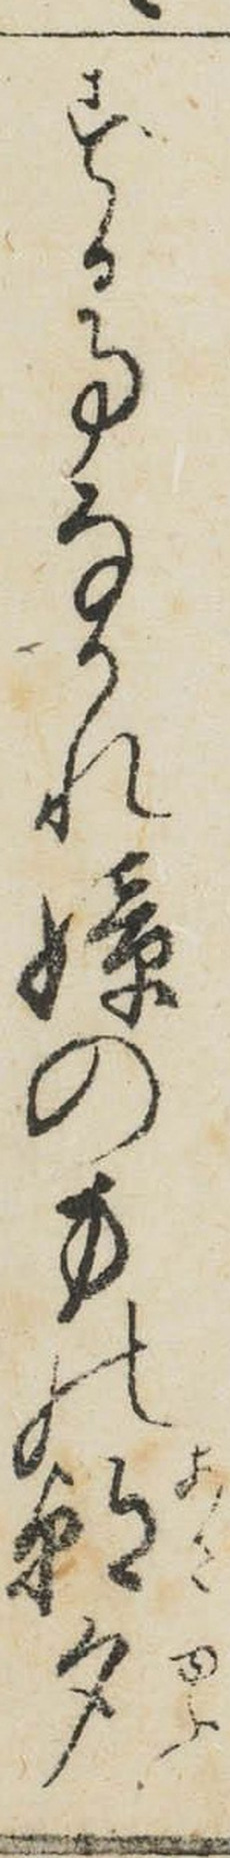ずる事なかれ嫜の方の朝夕
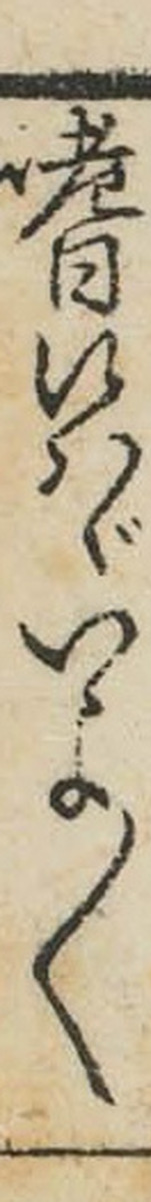嗜候はゞいよ〳〵
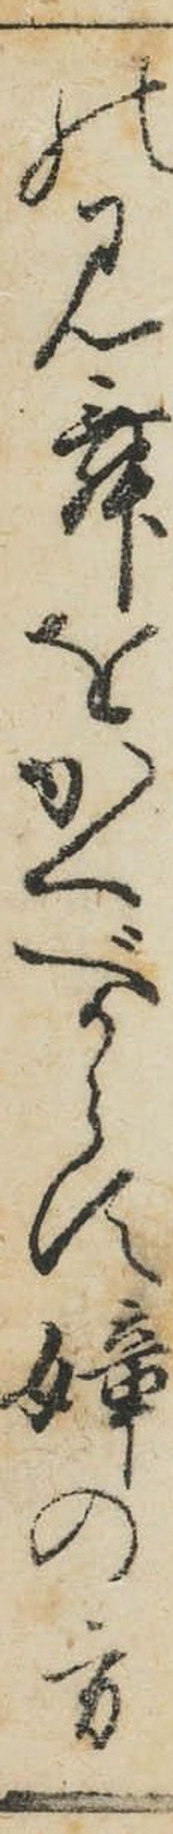の見舞をかくべからす嫜の方

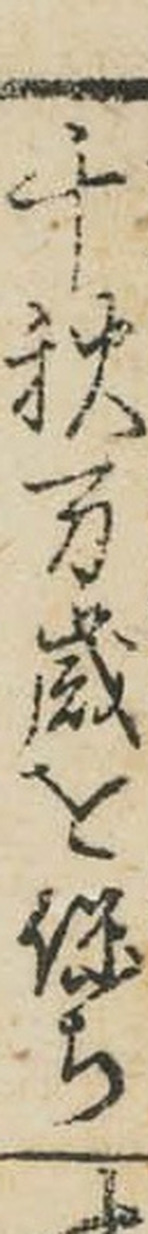千秋万歳を保ち
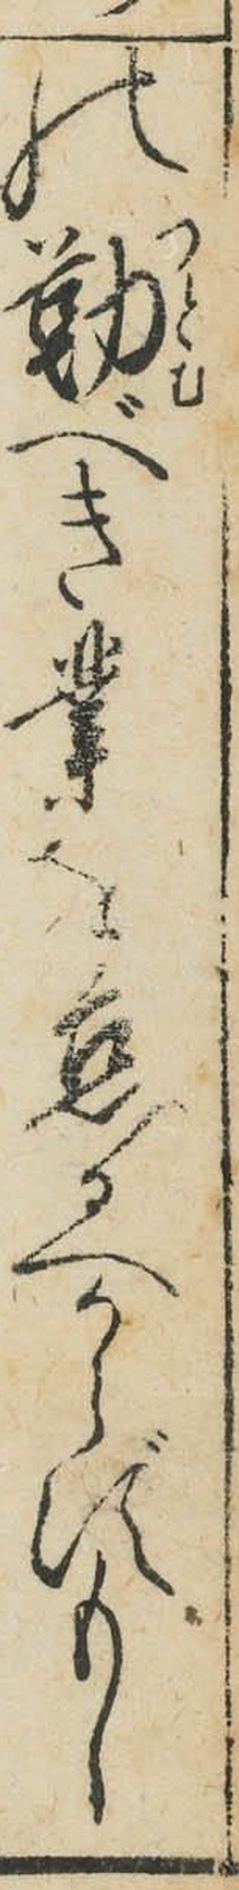の勤べき業を怠るへからずもし
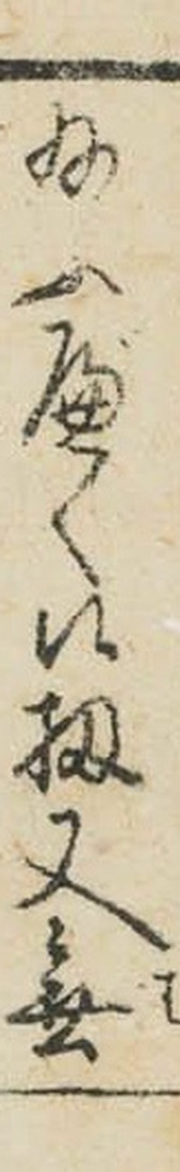給ふべく候扨又無
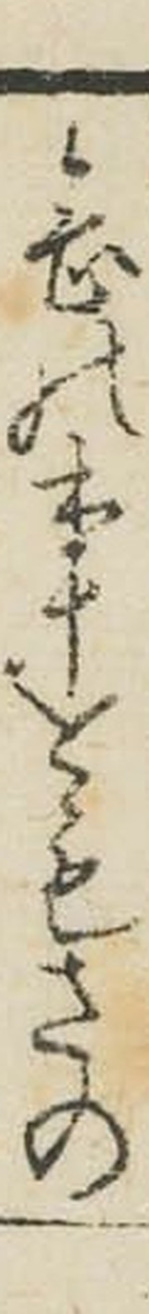念の事をもさの
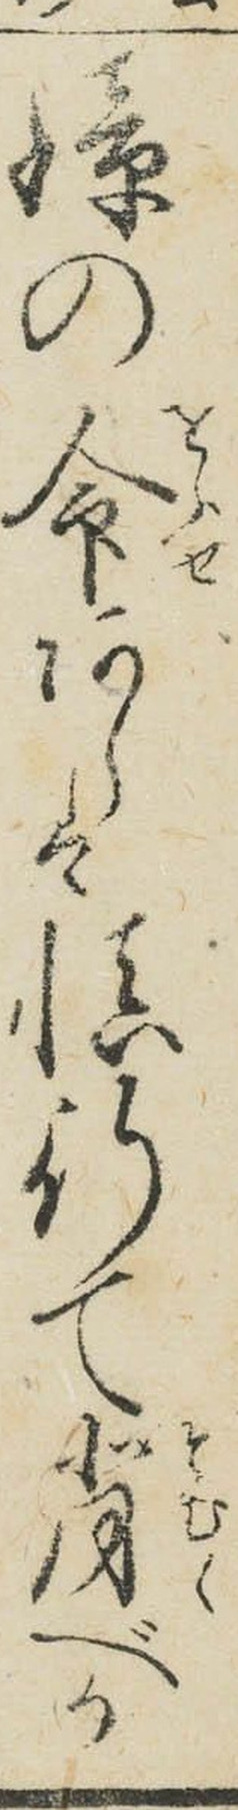嫜の令あらは慎行て背べか
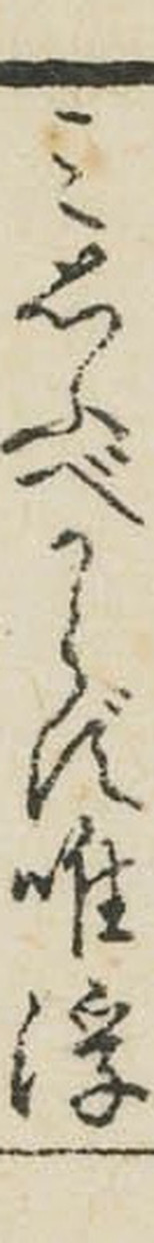み思ふべからず唯浮
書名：女大学
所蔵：東京学芸大学教育コンテンツアーカイブ
